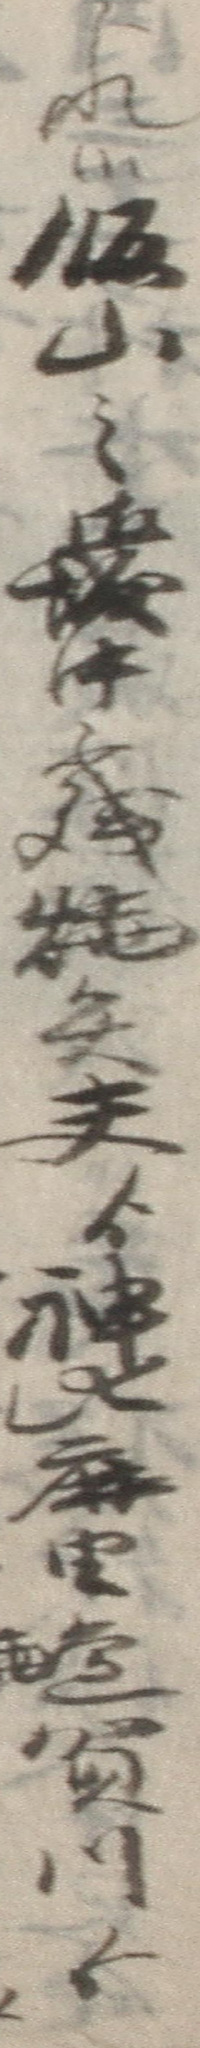れ候飯山之御城中不残焼失夫ゟ神代麻里辺賀川ゟ
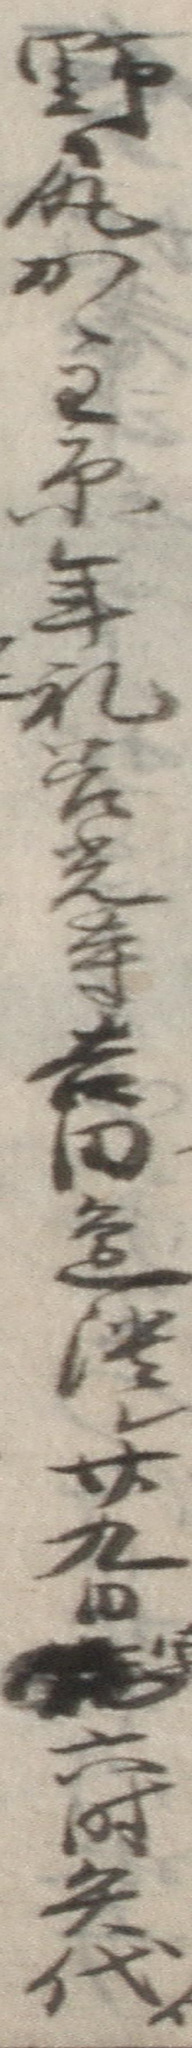野尻かゝわ原年礼善光寺吉田年潰れ廿九日晦六時矢代ゟ
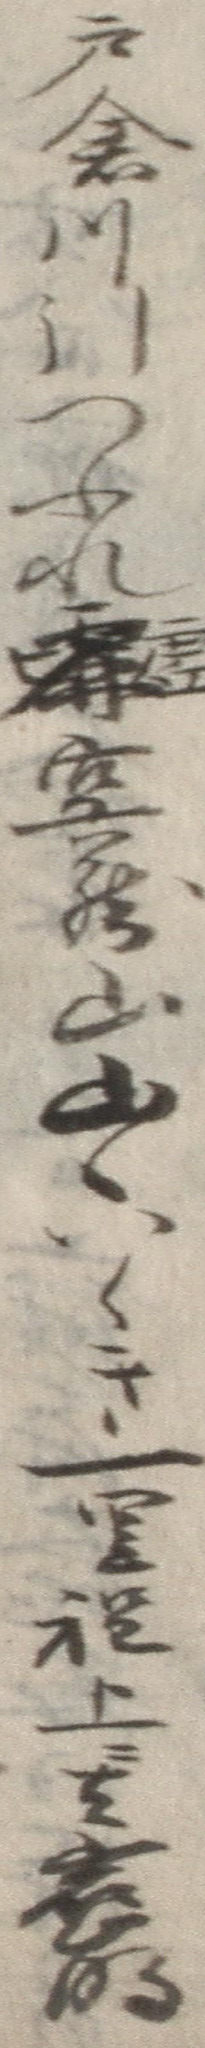戸倉川引つふれ虚空蔵山山ゝいくき一里程上二は岩崩
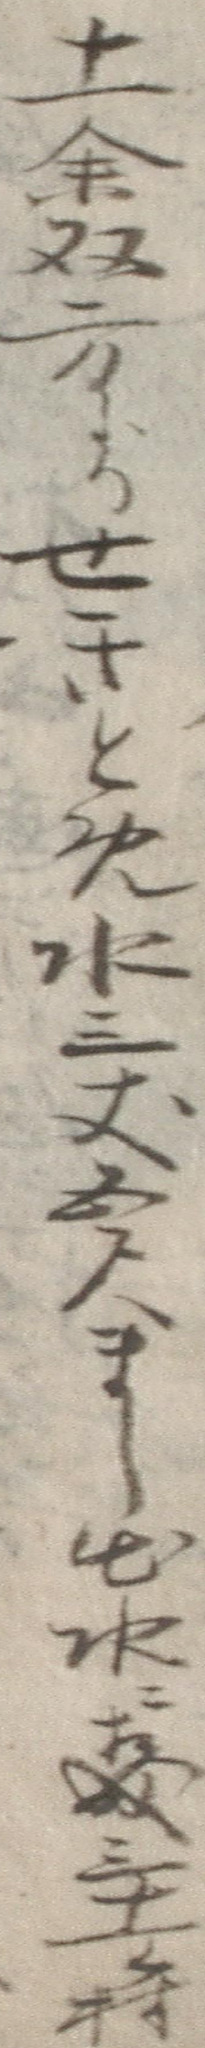十一余双方よりせきとめ水三丈五尺まし出水に相成三十一ケ村
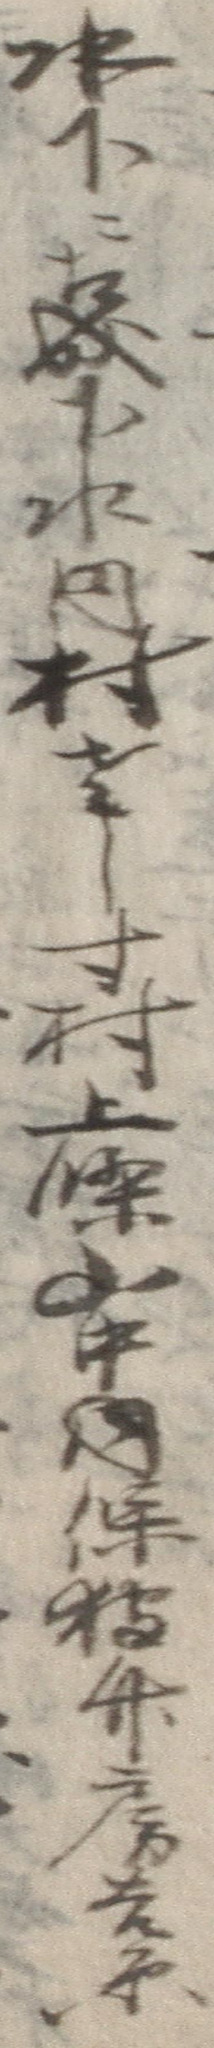水下に相成下水内村をしす村上條山中内保狩竹房吉原
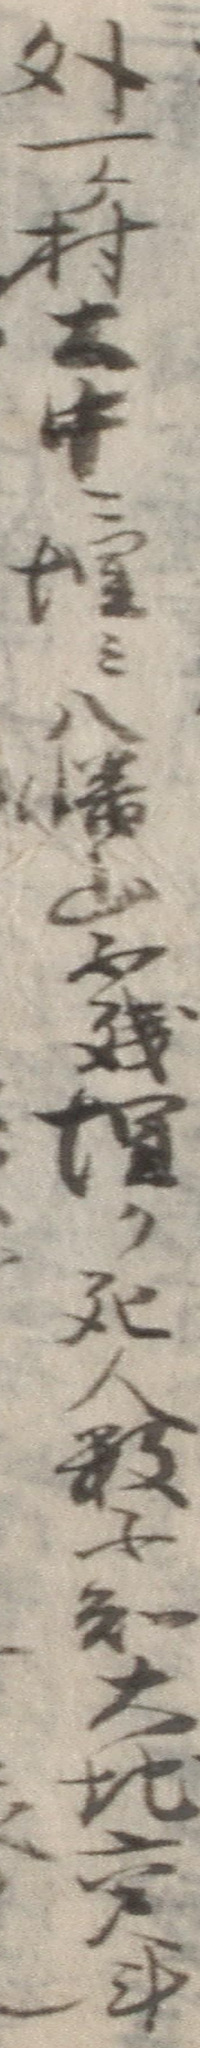外一ケ村土中に埋み八幡山不残埋り死人数不知大地六尺斗
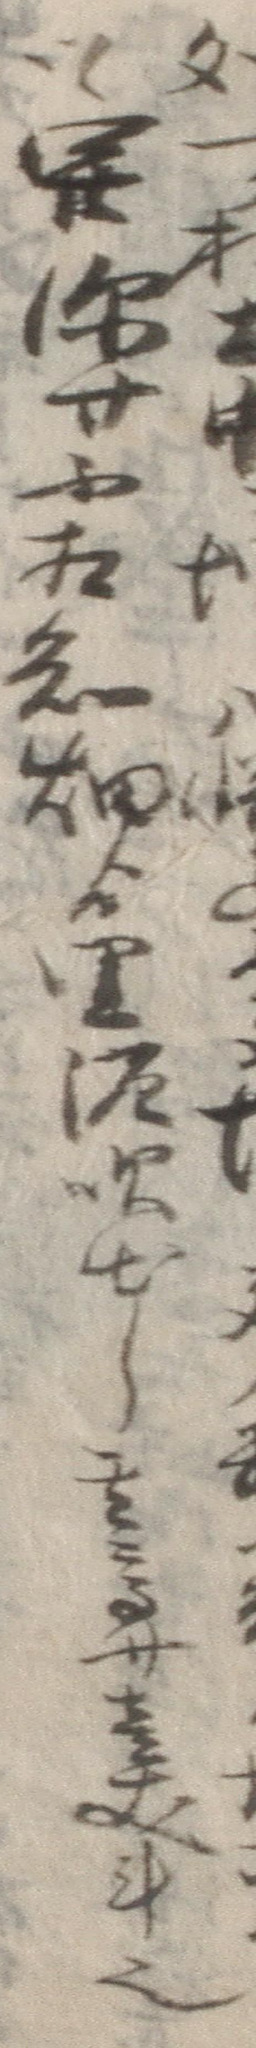も開深さ不相知畑ゟ里泥吹出し其高サ壱丈斗也
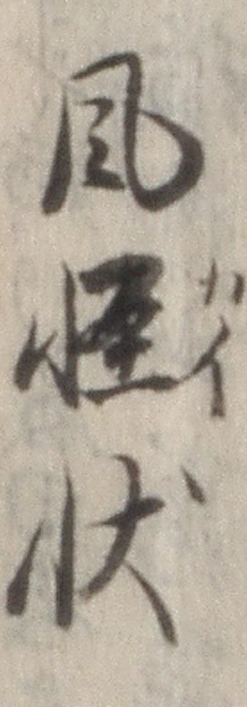風怪状
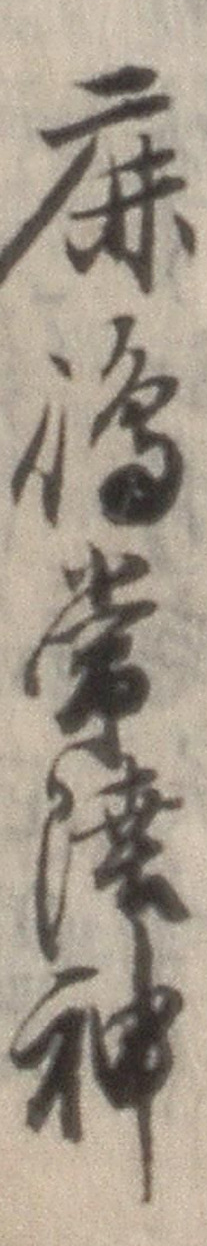鹿嶋常陸神
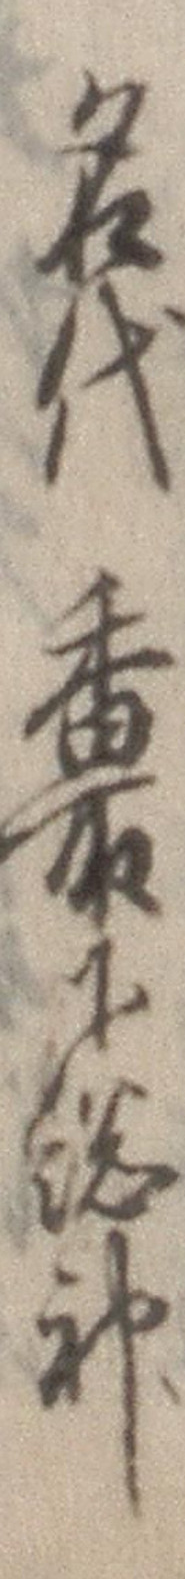名代香取下総神
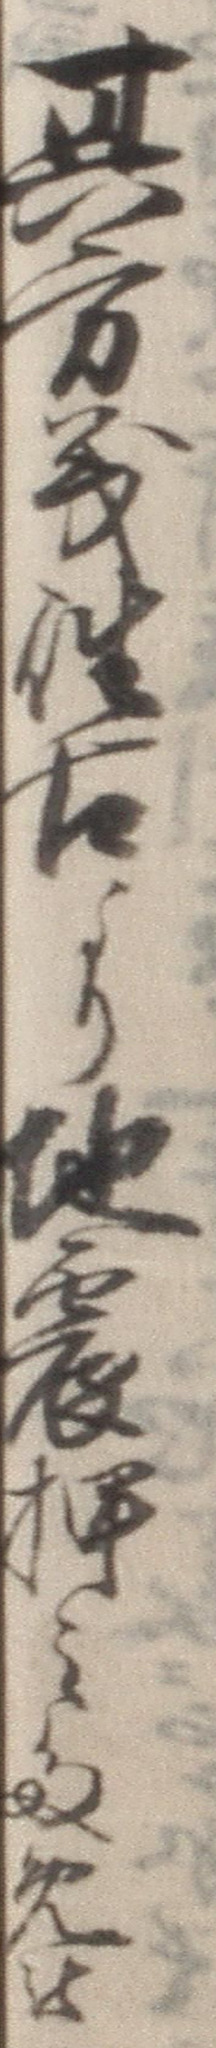其方義往古より地震押之ため被
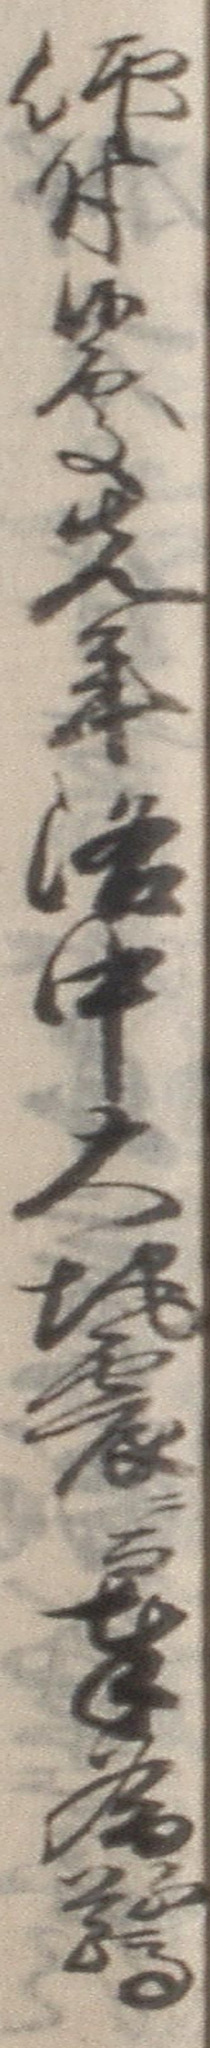仰付候處先年洛中大地震に而奉為驚
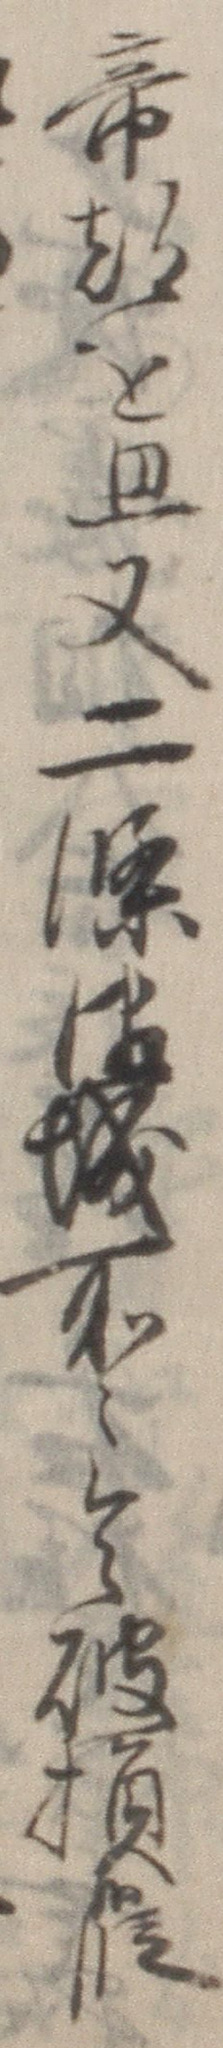帝都を且又ニ條御城所〻今破損候段
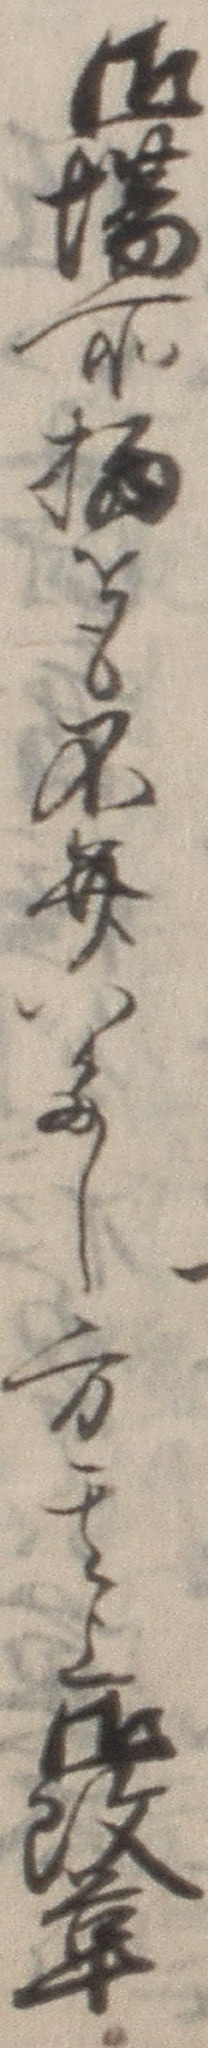御場所柄をも不弁いたし方其上御改革
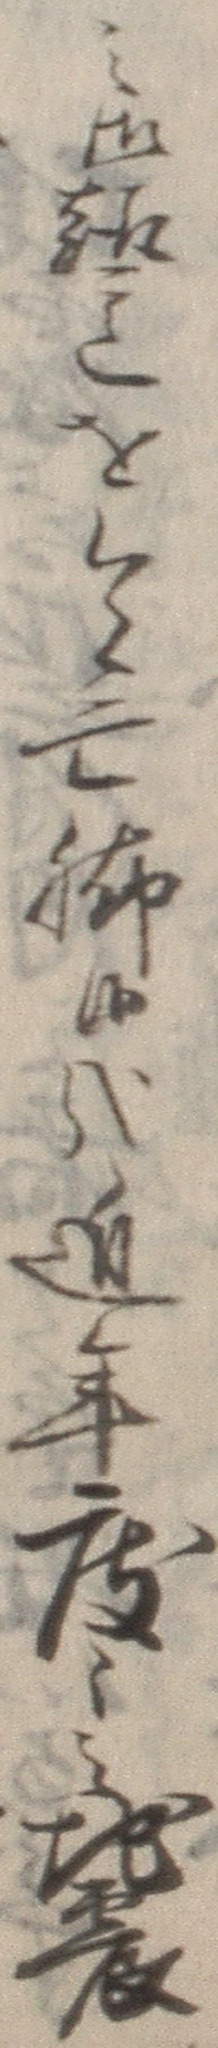之御趣意を今亡脚候哉近年度〻之地震
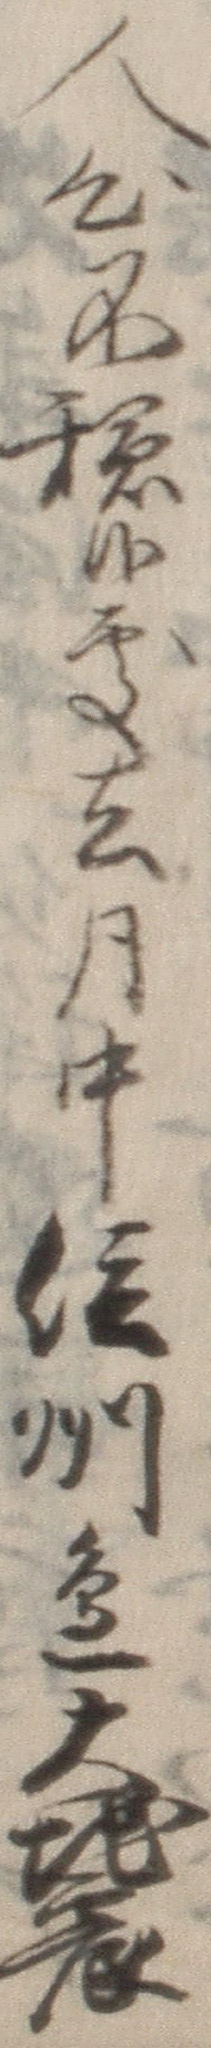人心不穏候處去月中信州辺大地震
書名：[善光寺地震に関する冊子]
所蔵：東京大学地震研究所図書室 Earthquake Research Institute Library, The University of Tokyo, JAPAN
